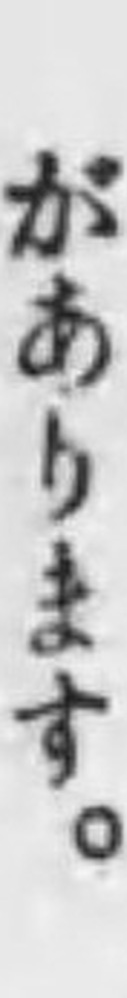があります。
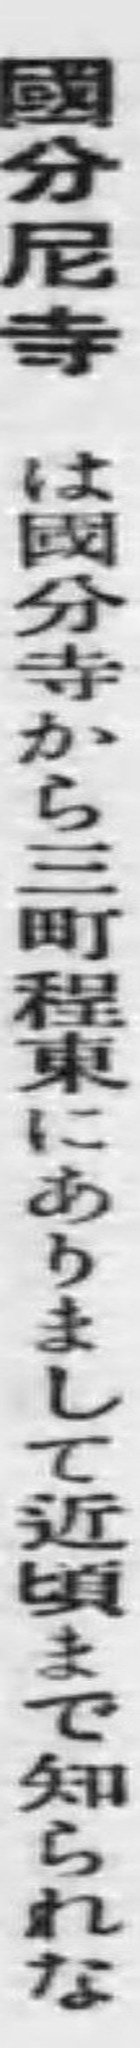国分尼寺は国分寺から三町程東にありまして近頃まで知られな
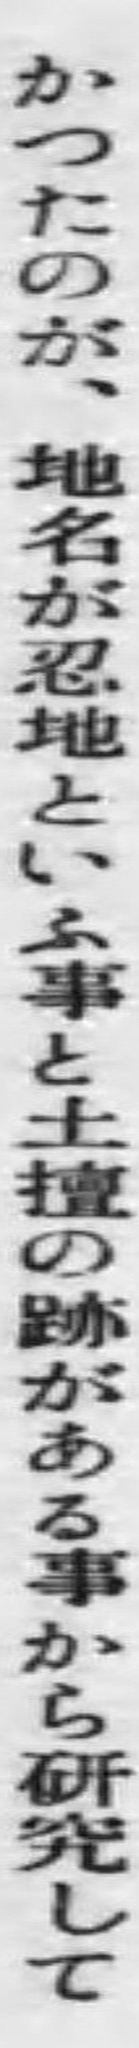かつたのが、地名が忍地といふ事と土擅の跡がある事から研究して
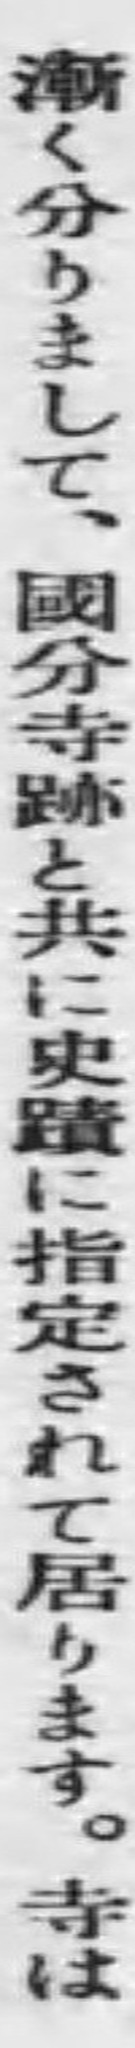漸く分りまして、国分寺跡と共に史蹟に指定されて居ります。寺は
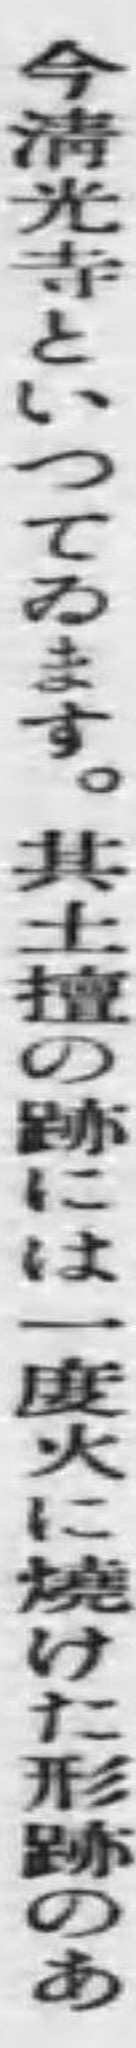今清光寺といつてゐます。其土擅の跡には一度火に焼けた形跡のあ
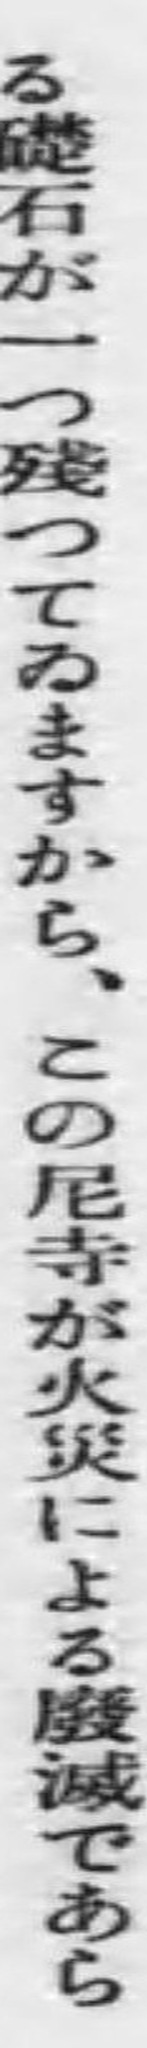る礎石が一つ残つてゐますから、この尼寺が火災による廃滅であら
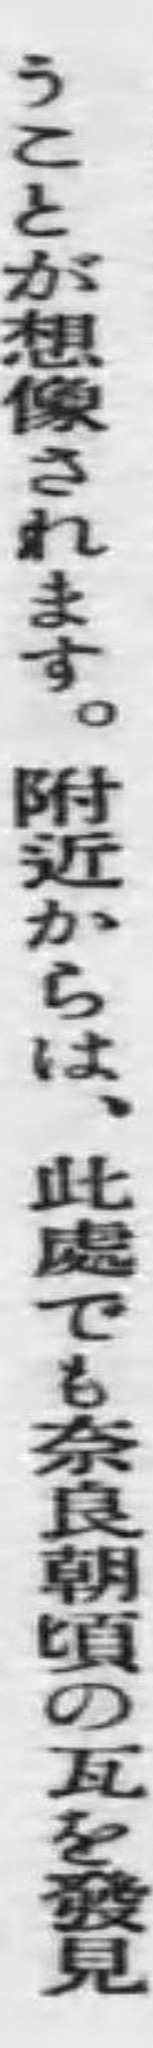うことが想像されます。附近からは、此処でも奈良朝頃の瓦を発見
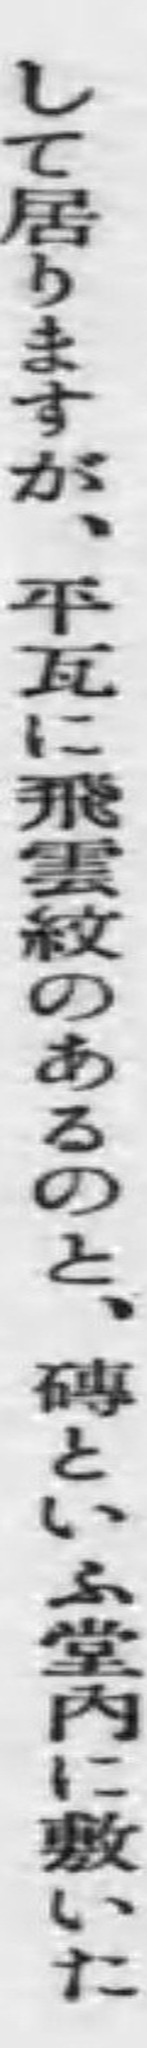して居りますが、平瓦に飛雲紋のあるのと、磚といふ堂内に敷いた
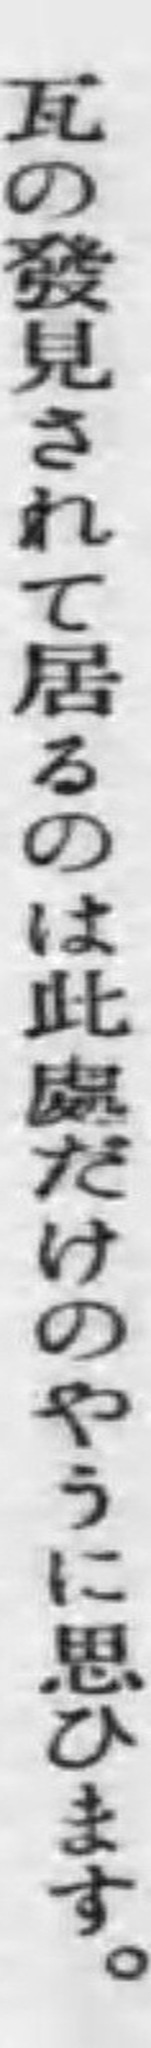瓦の発見されて居るのは此処だけのやうに思ひます。
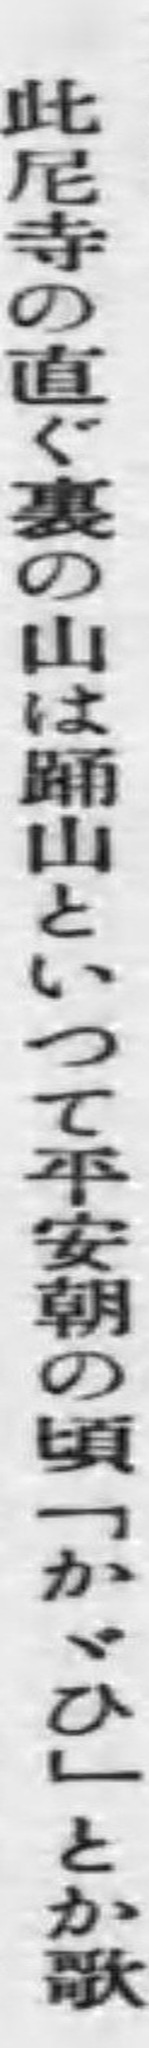此尼寺の直ぐ裏の山は踊山といつて平安朝の頃「かゞひ」とか歌
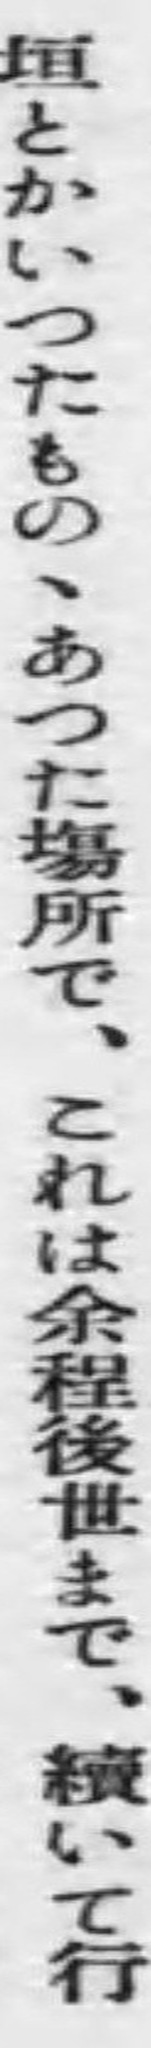垣とかいつたものゝあつた場所で、これは余程後世まで、続いて行
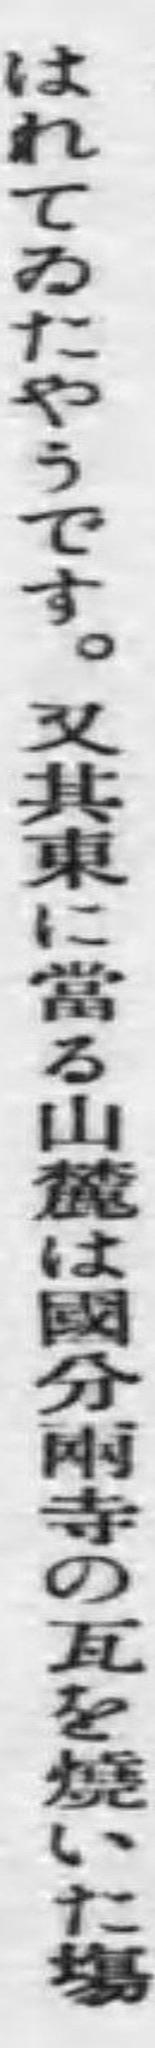はれてゐたやうです。又其東に当る山麓は国分両寺の瓦を焼いた場
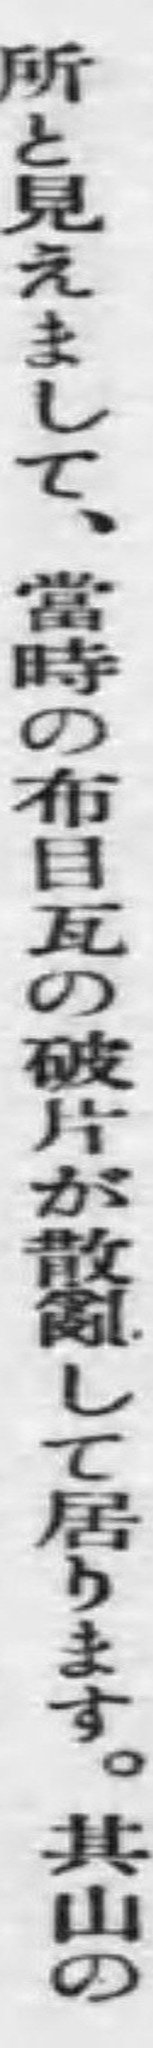所と見えまして、当時の布目瓦の破片が散乱して居ります。其山の
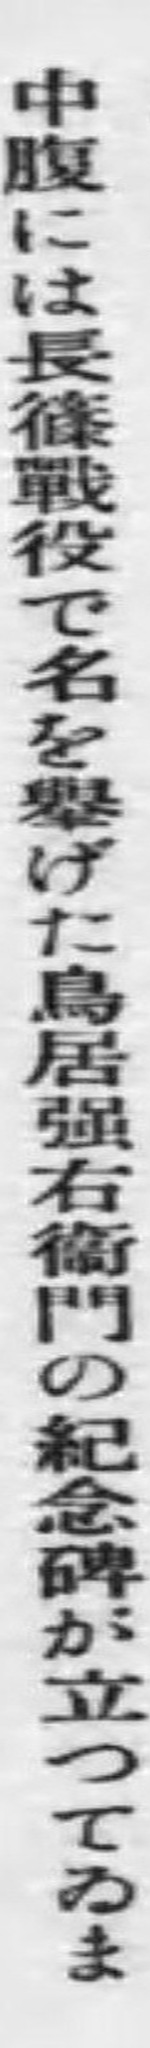中腹には長篠戦役で名を挙げた鳥居強右衛門の紀念碑が立つてゐま
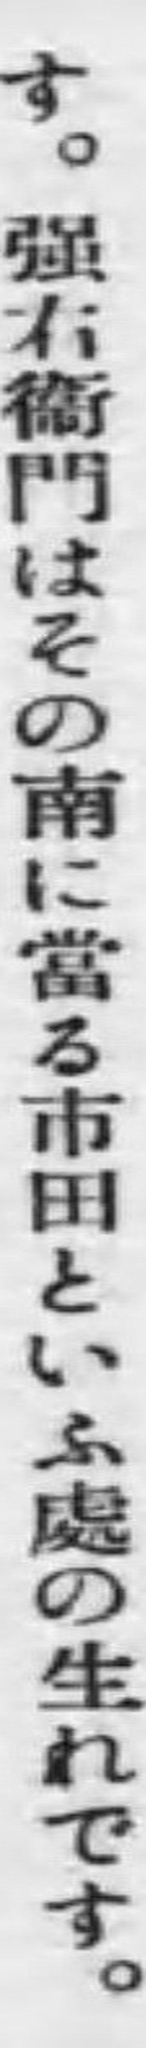す。強右衛門はその南に当る市田といふ処の生れです。
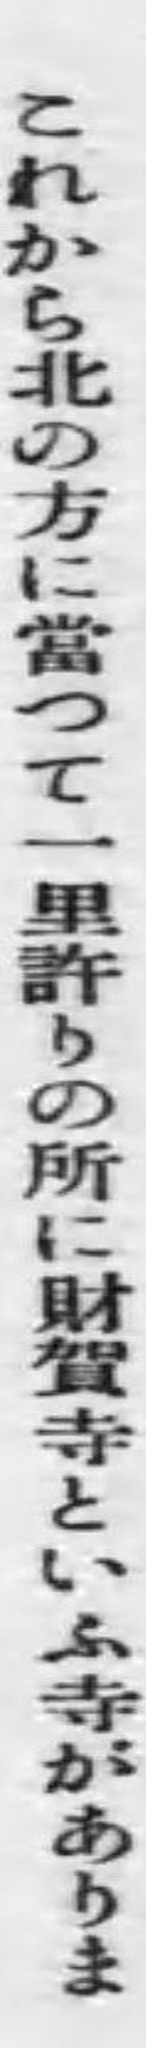これから北の方に当つて一里許りの所に財賀寺といふ寺がありま
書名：東三河道中記 : 豊橋市及其附近案内
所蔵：国立国会図書館 National Diet Library, JAPAN
